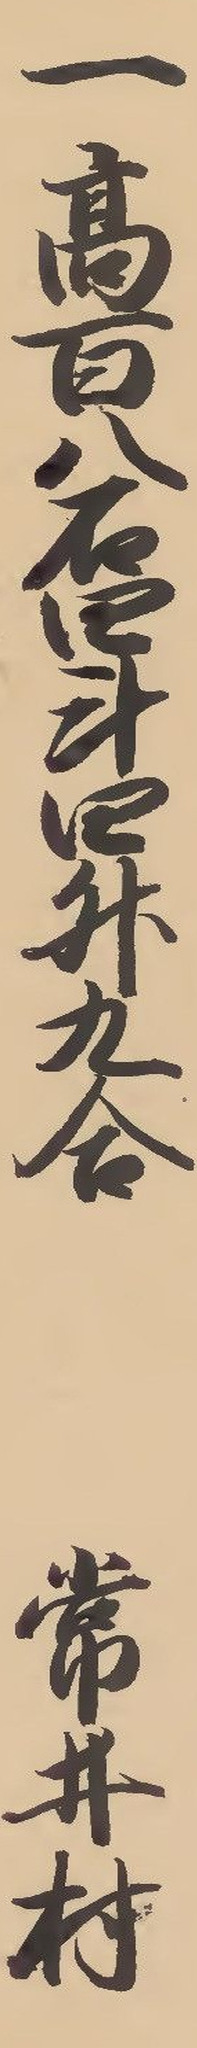一高百八石四斗四升九合常井村

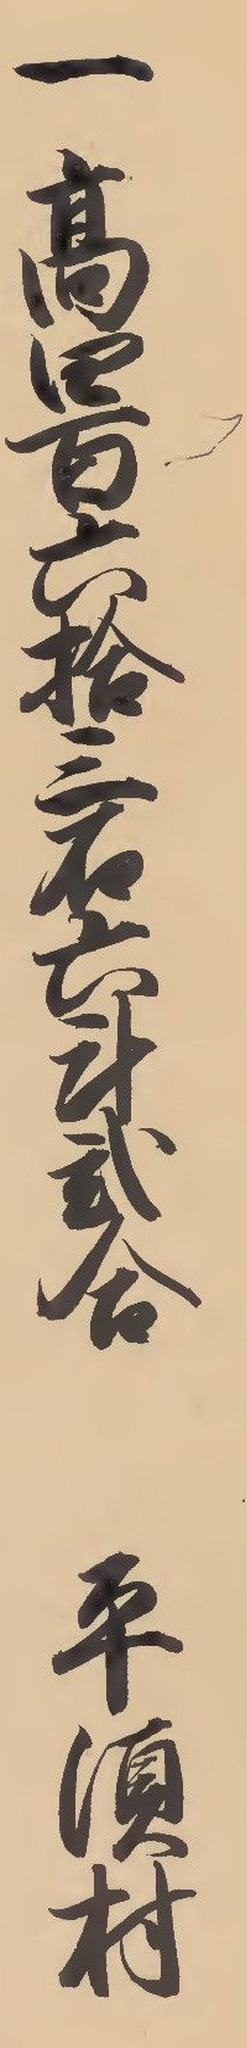一高四百六拾三石六斗弐合平須村
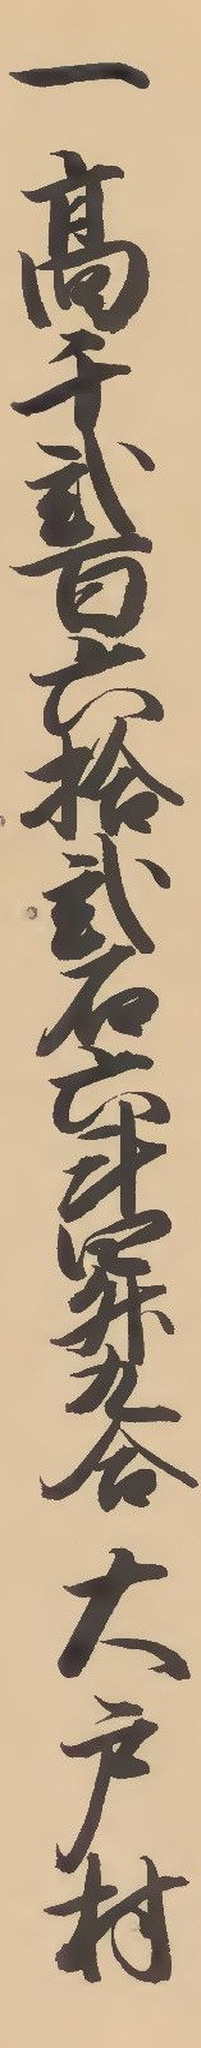一高千弐百六拾弐石六斗四升九合大戸村
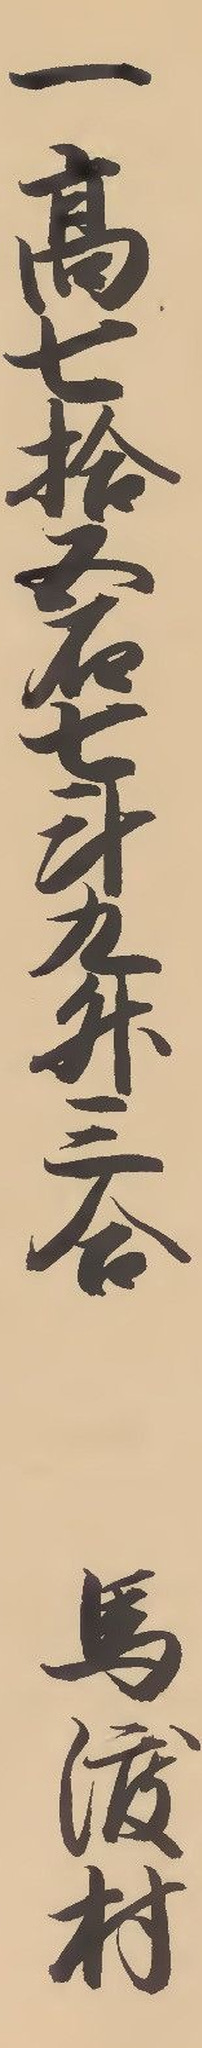一高七拾五石七斗九升三合馬渡村
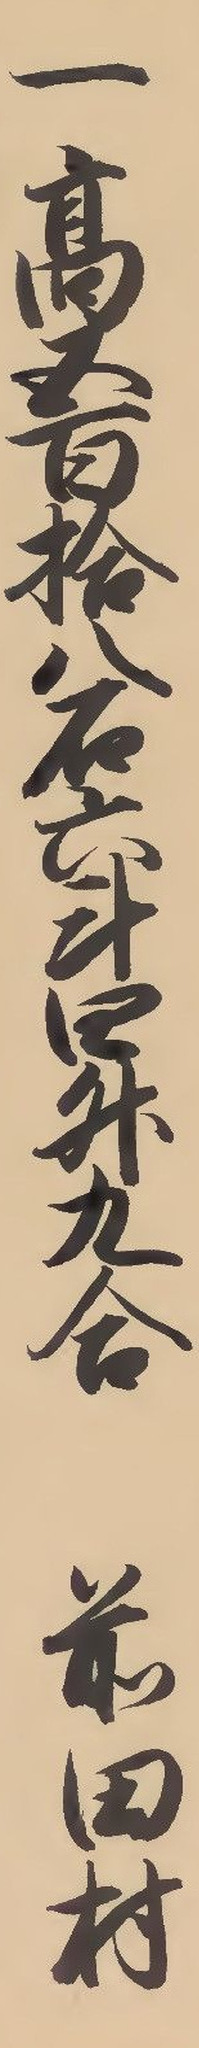一高五百拾八石六斗四升九合前田村
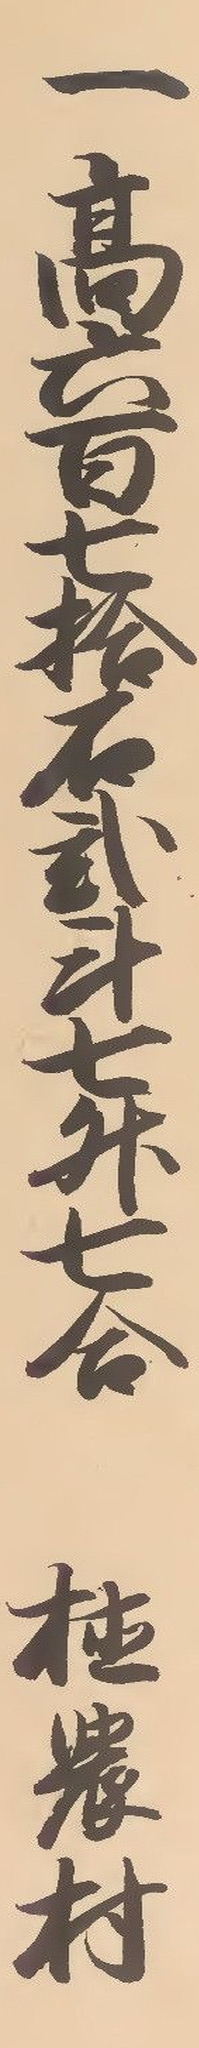一高六百七拾石弐斗七升七合植農村
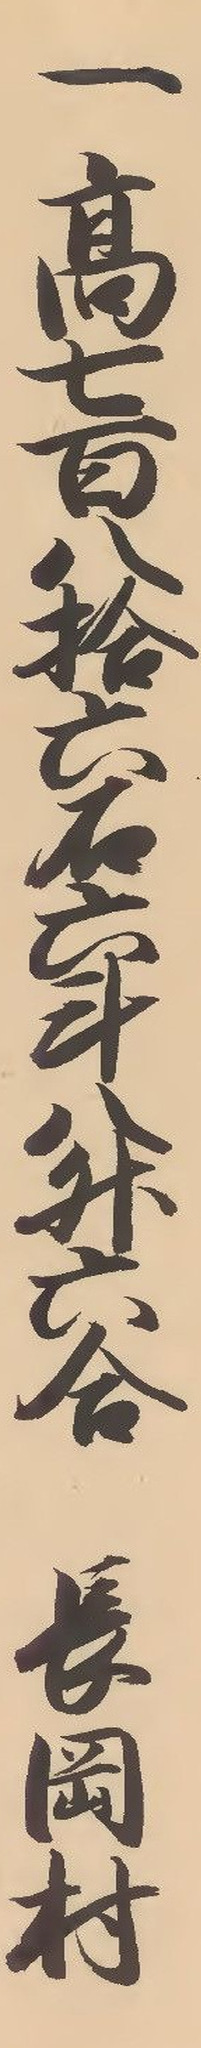一高七百八拾六石六斗八升六合長岡村
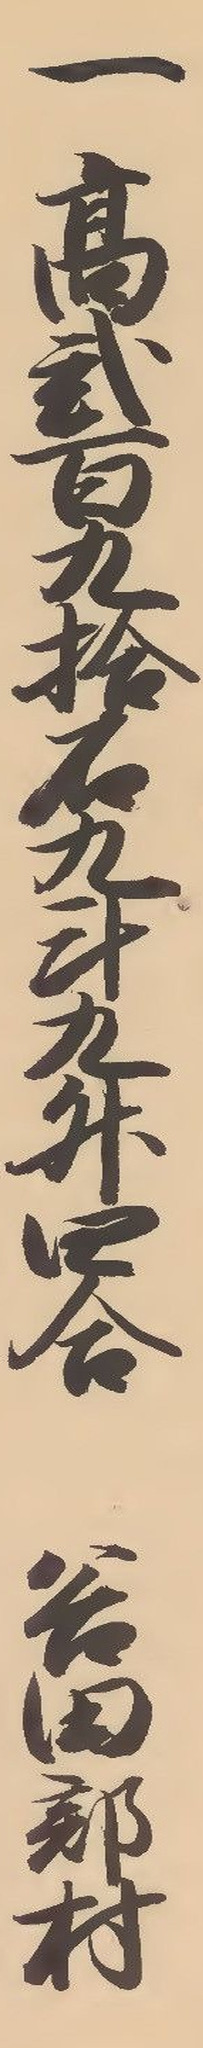一高弐百九拾石九斗九升四合谷田部村
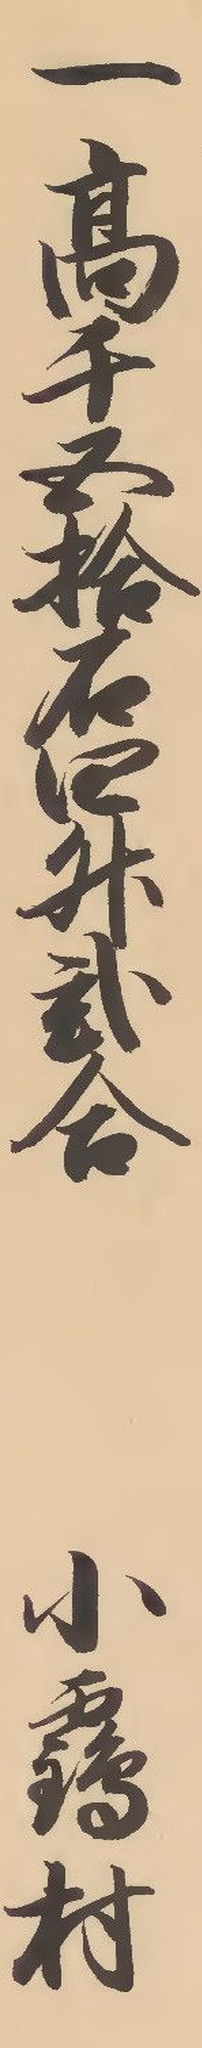一高千五拾石四升弐合小鶴村

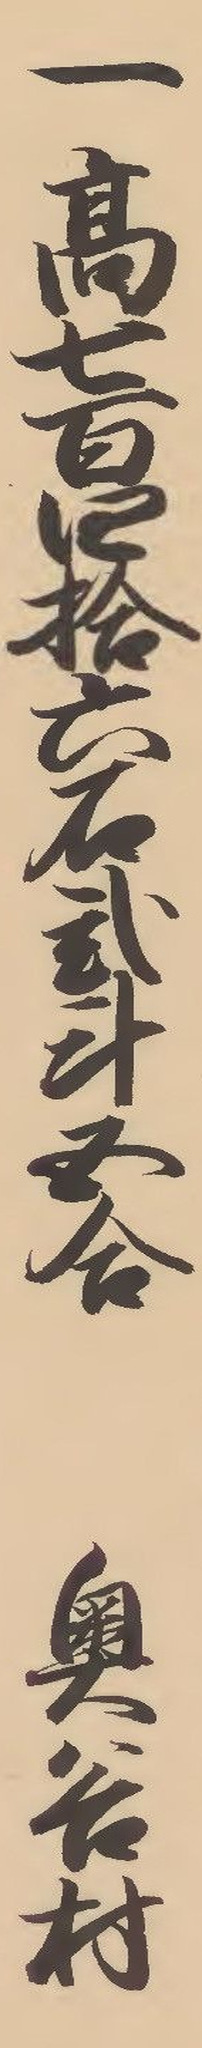一高七百四拾六石弐斗五合奥谷村
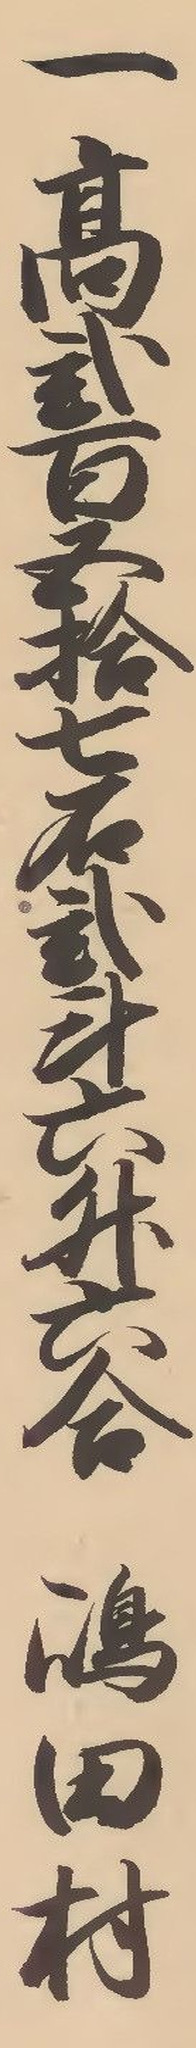一高弐百五拾七石弐斗六升六合島田村
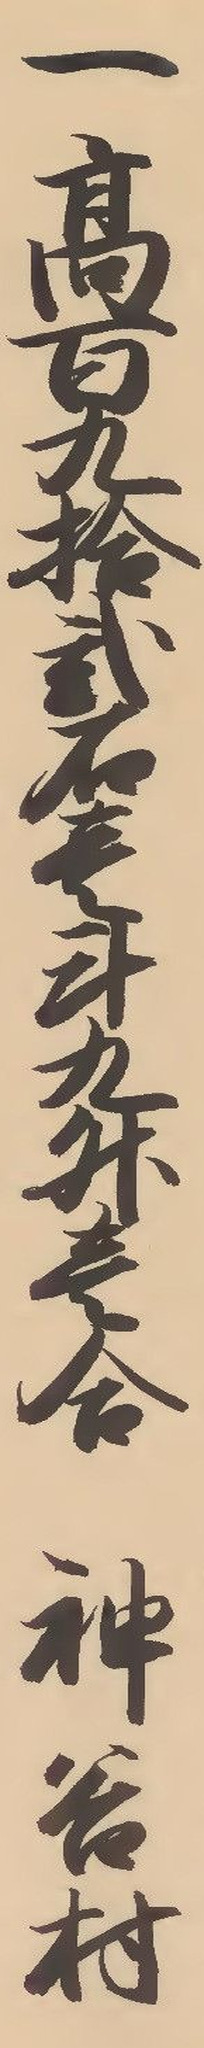一高百九拾弐石壱斗九升壱合神谷村
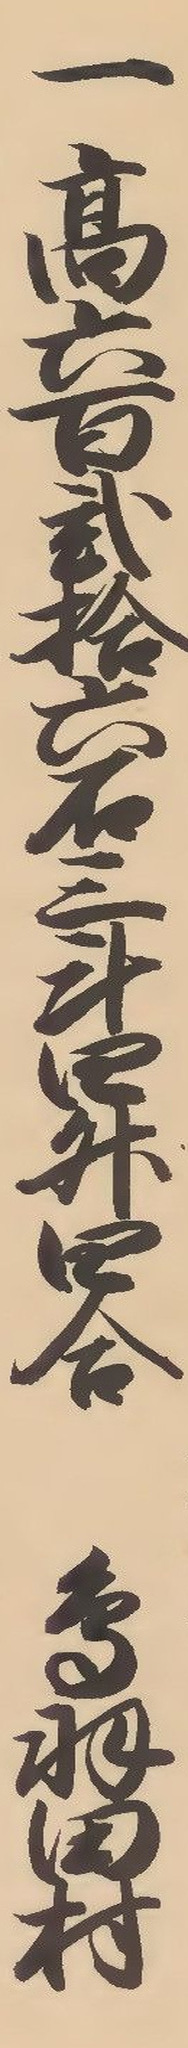一高六百弐拾六石三斗四升四合鳥羽田村
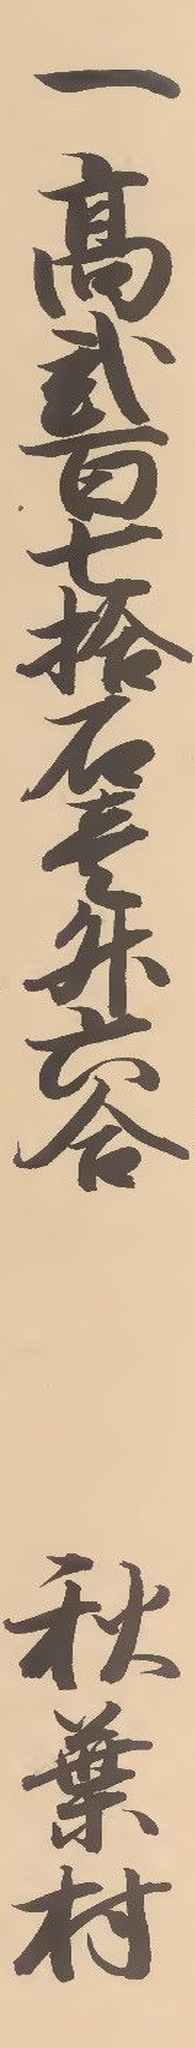一高弐百七拾石壱升六合秋葉村
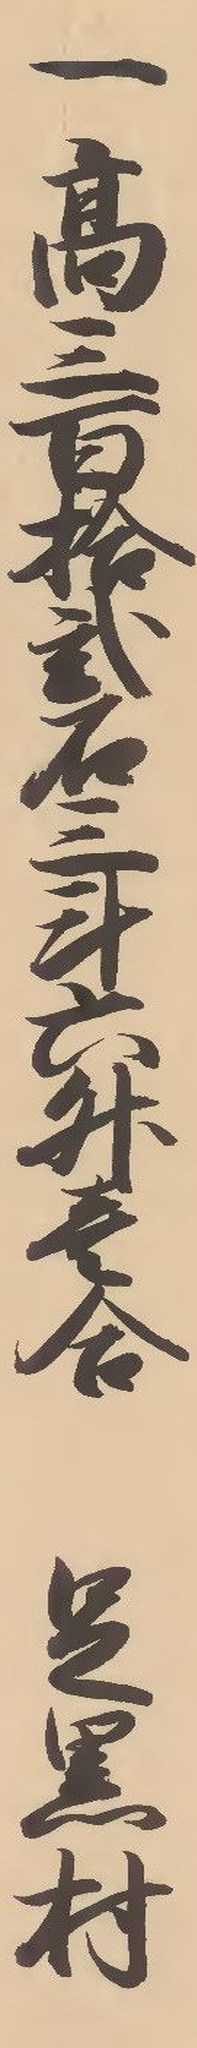一高三百拾弐石三斗六升壱合足黒村
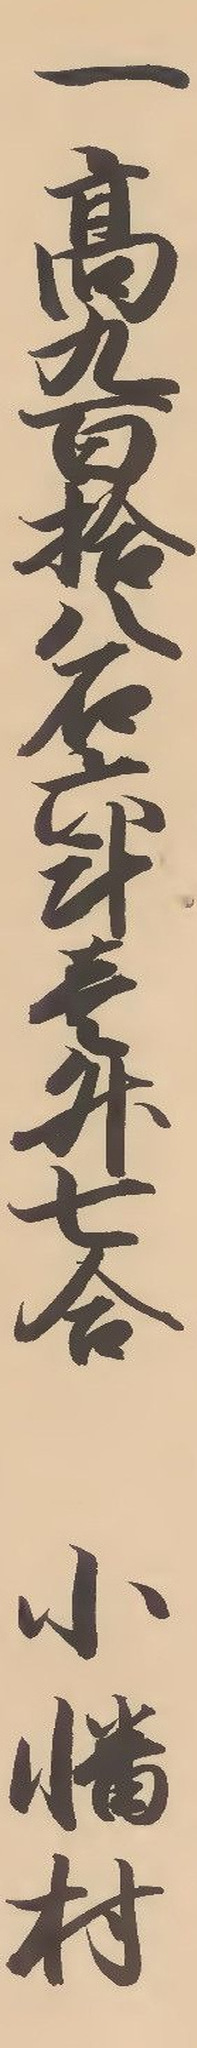一高九百拾八石六斗壱升七合小幡村
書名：常陸国郷帳
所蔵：国立公文書館 National Archives of Japan
